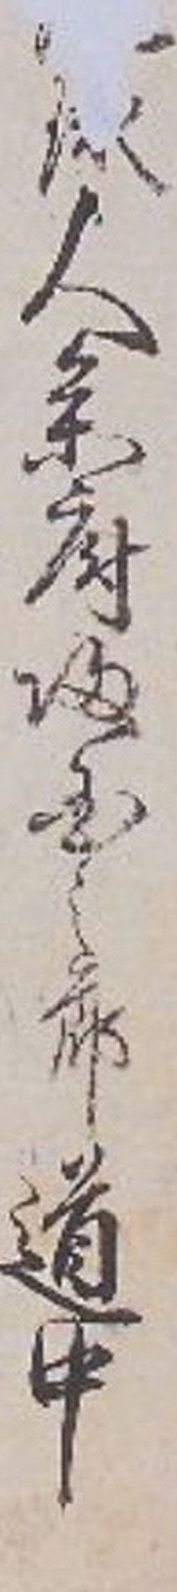去辰人参府帰国之節道中
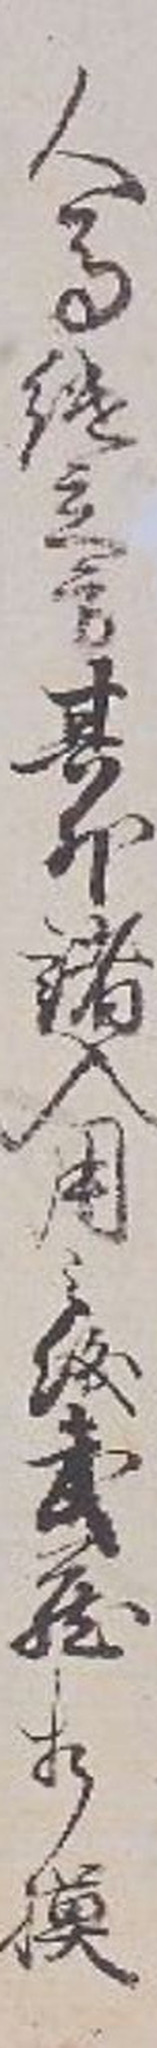人馬継立方其外諸入用之儀武蔵相模
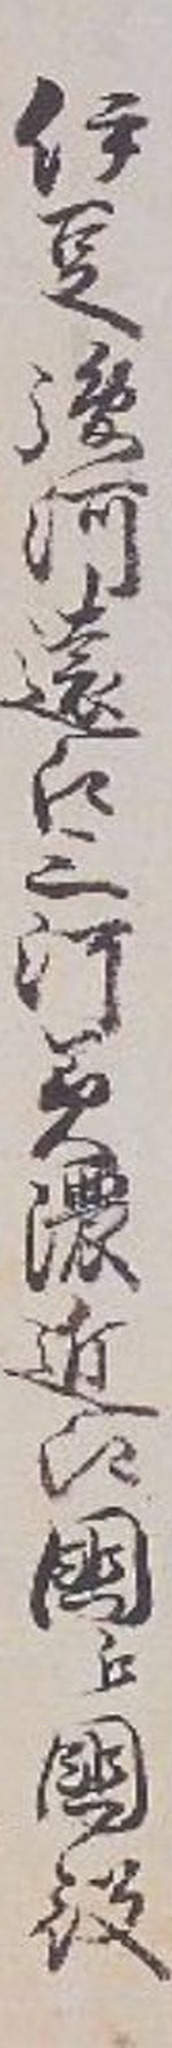伊豆駿河遠江三河美濃近江国え国役
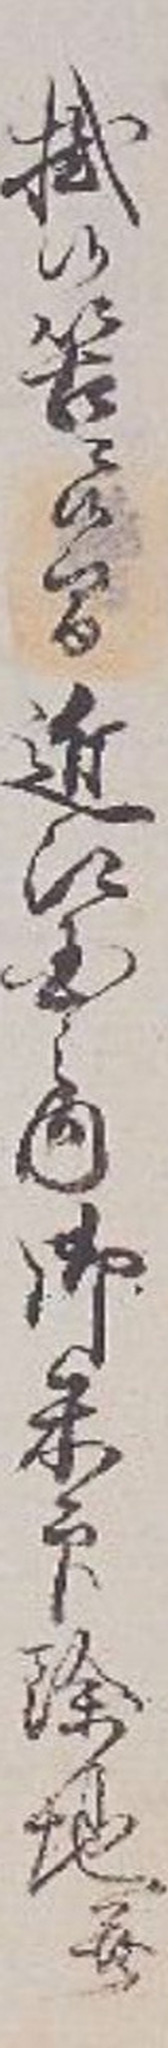掛候筈に候間近江国之内御朱印除地幷
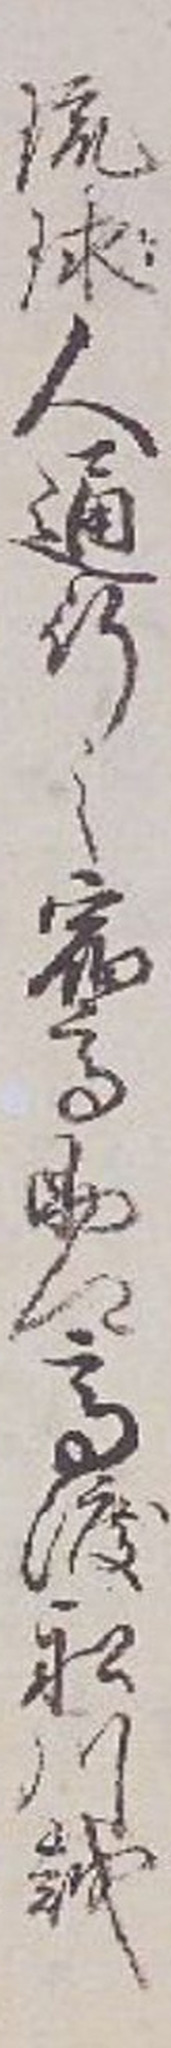琉球人通行之宿高助郷高渡船川越
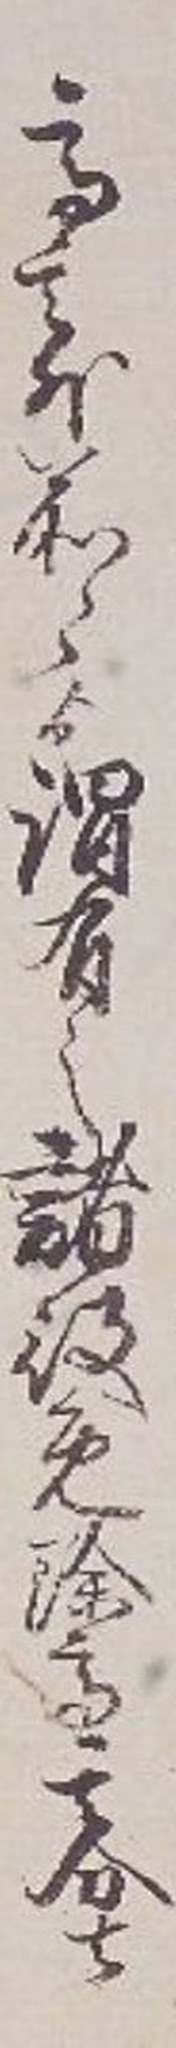高其外前々ゟ謂有之諸役免除高其分者
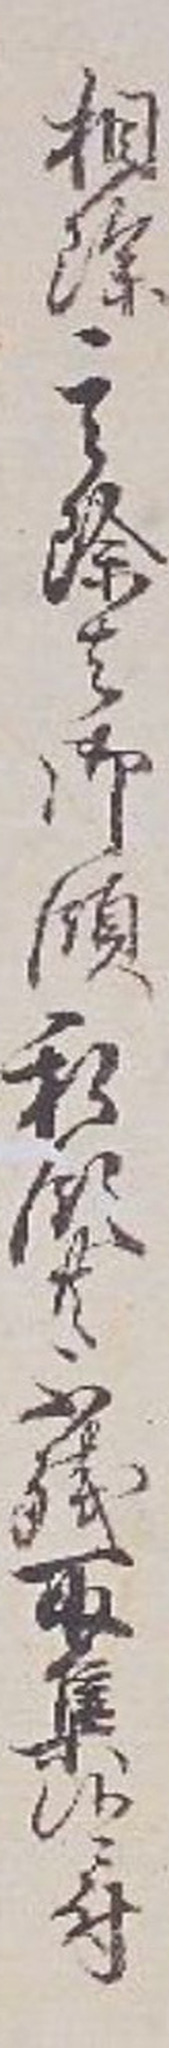相除其除者御領私領共不残取集候に付
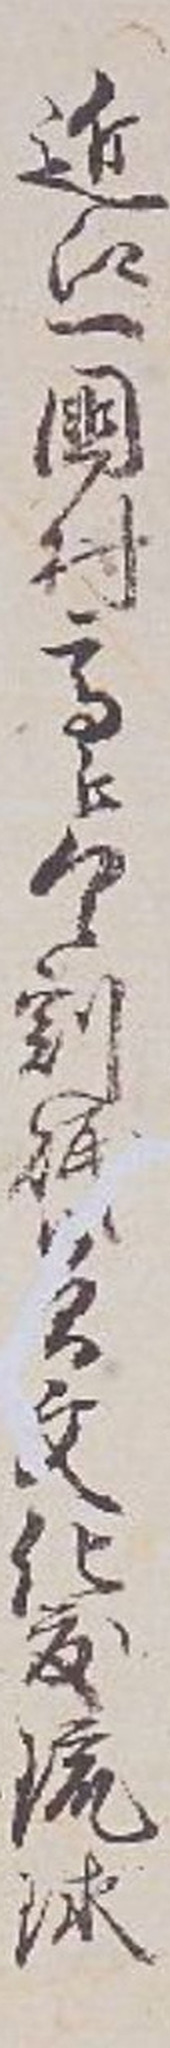近江一国村高え郷割賦候間文化度琉球
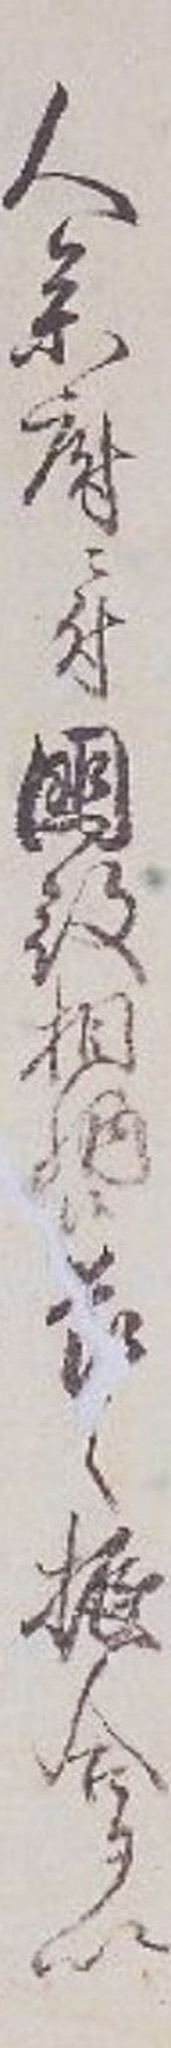人参府に付国役相納候節者振合ヲ以
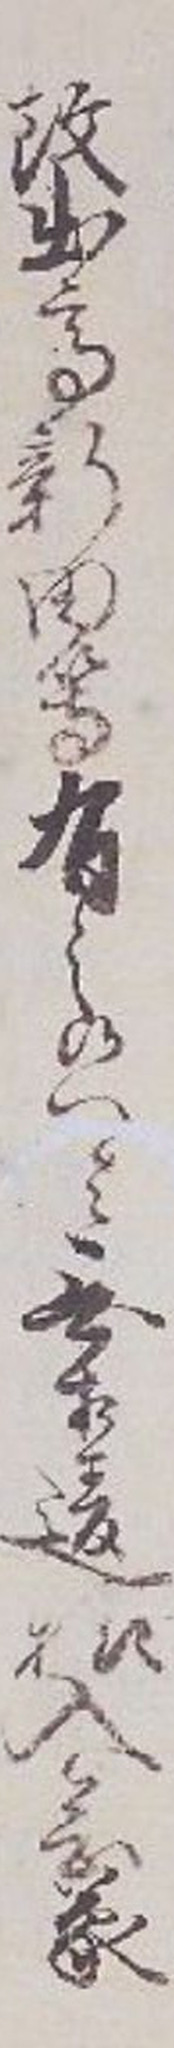改出高新田等有之候へ者無相違様入念義
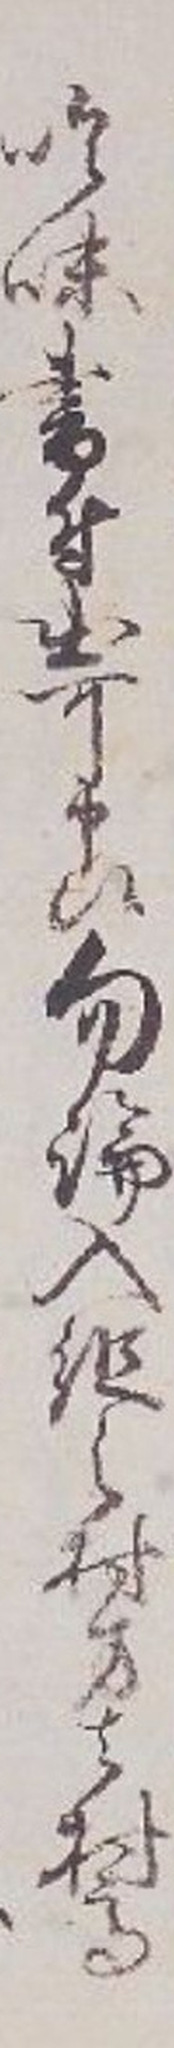吟味書付出可申候勿論入組之村方者村高
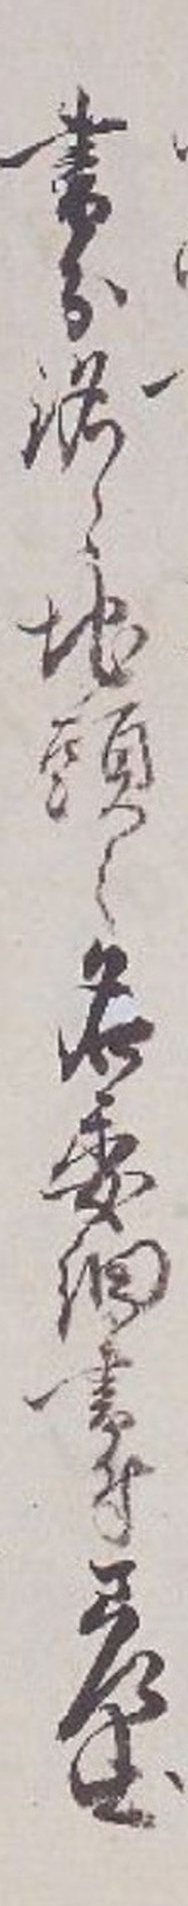書分銘々地頭之名委細書付差出
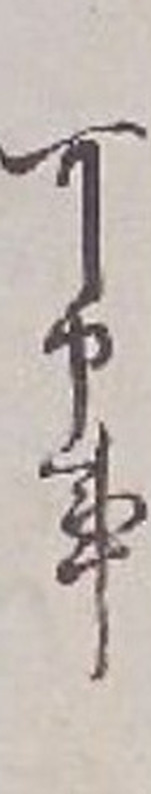可申事
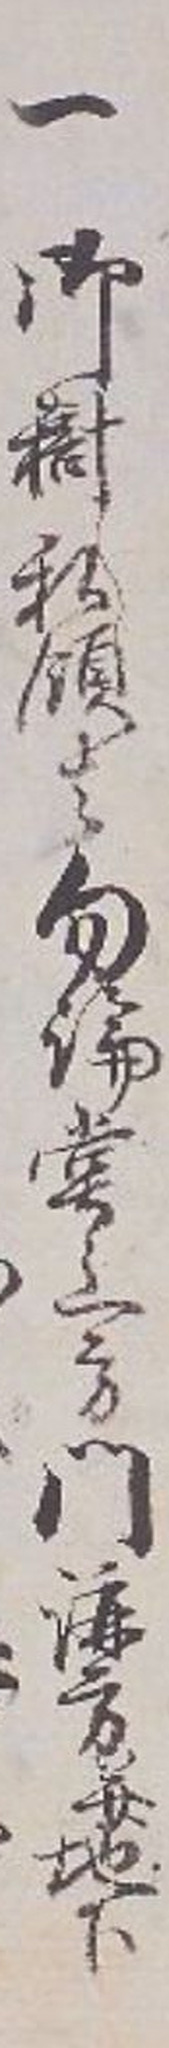一御樹私領者勿論堂上方門跡方幷地下
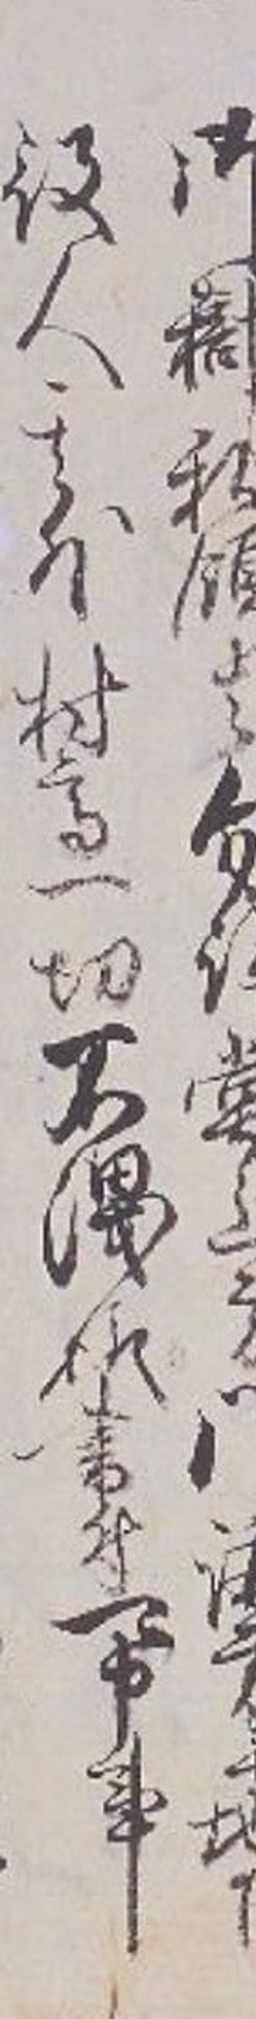役人其外村方一切不洩書付可申事
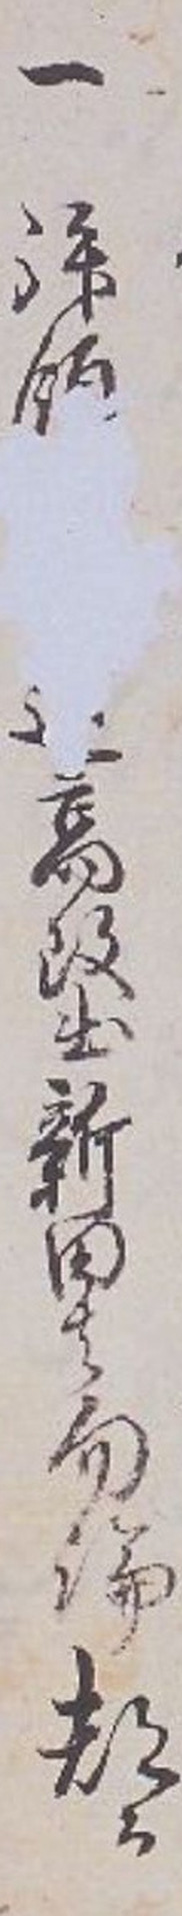一拝領高改出新田者勿論都而
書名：琉球人帰国に付国役金の記録
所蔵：University of the Ryukyus Library
